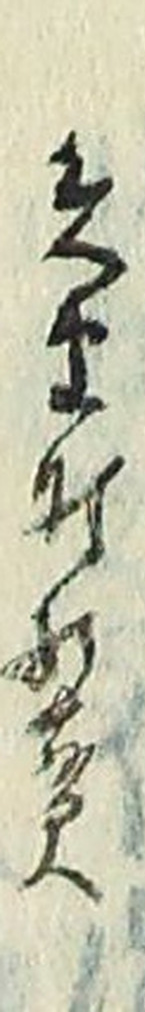矢野村肝煎
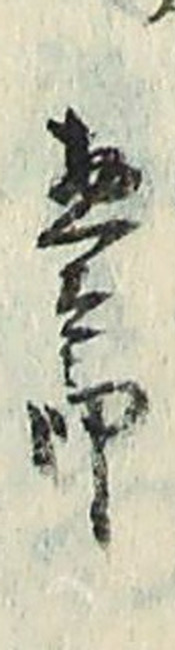惣太郎
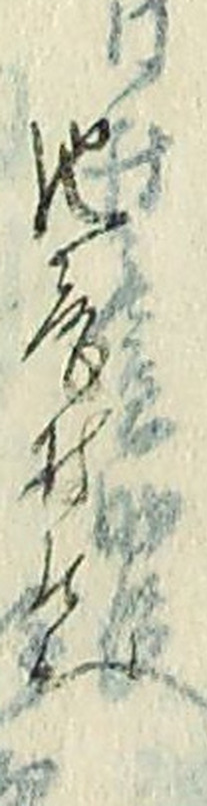池尻村庄屋
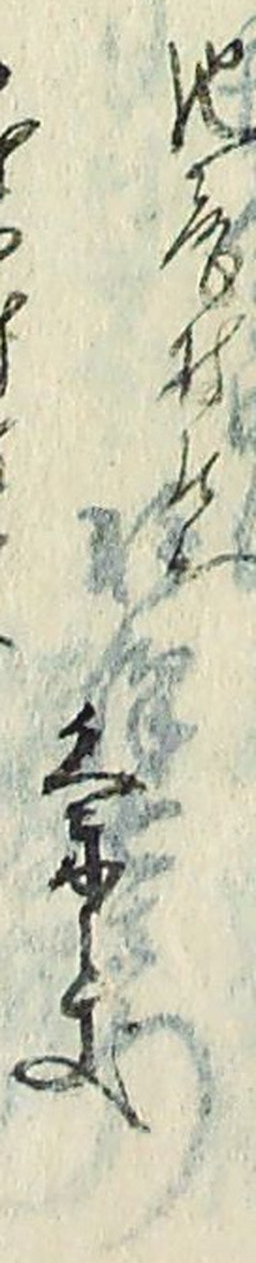久米之丈
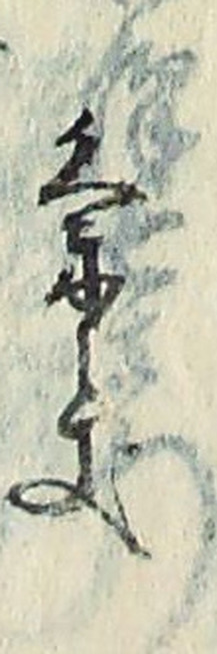久米之丈
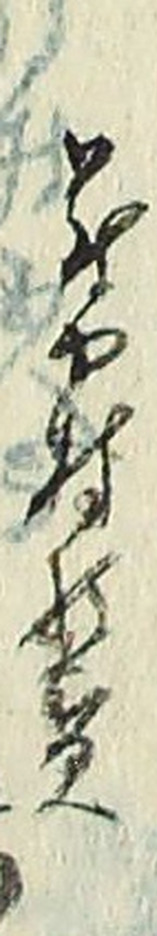府中村肝煎
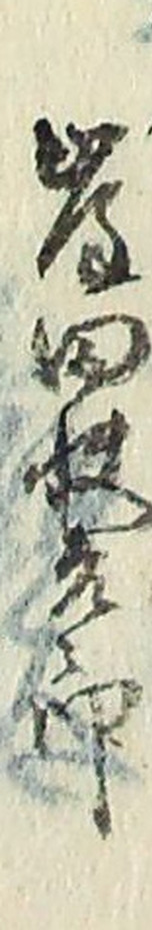岸田快吉郎
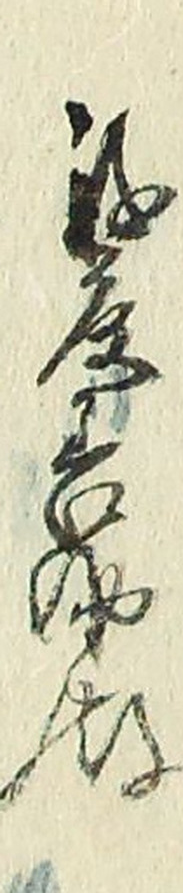後藤善助殿
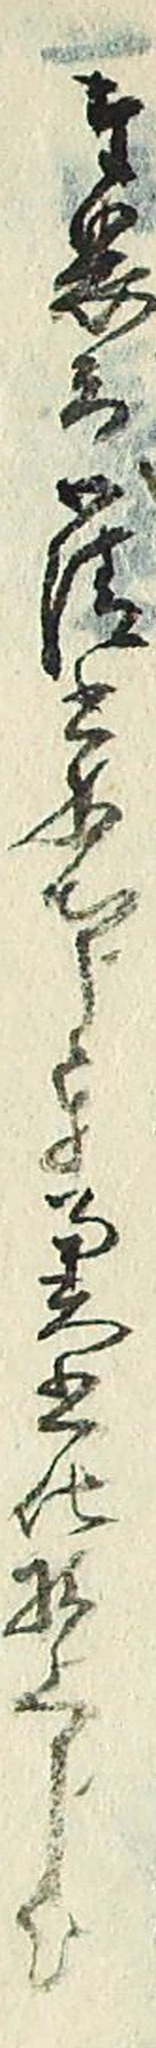奉畏旨御請書指上申に付奥書仕指上申候以上
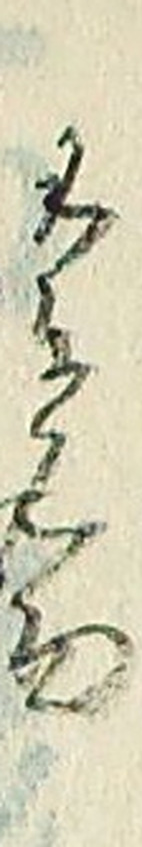名東名西
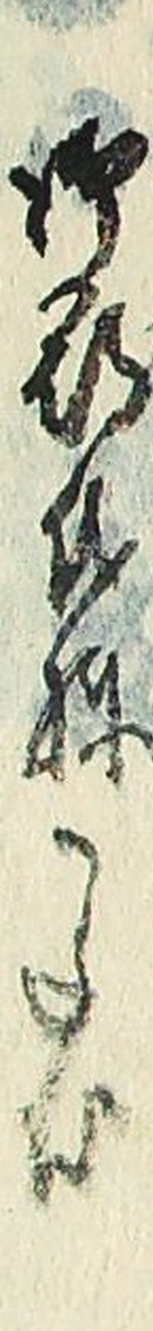御郡代様御手代
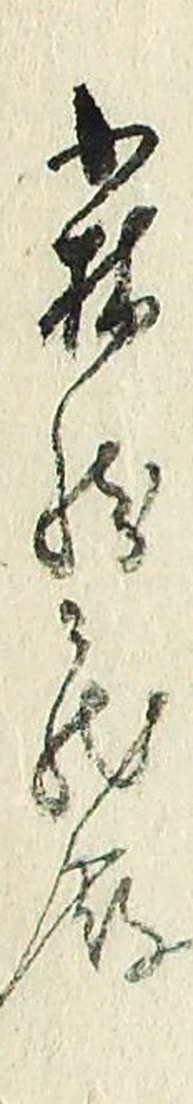小林龍蔵殿
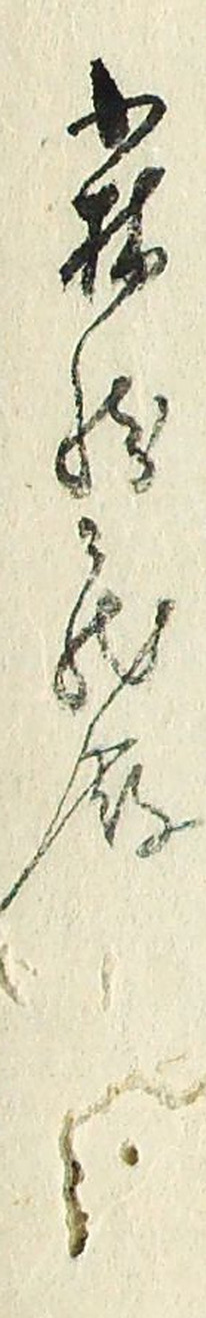小林龍蔵殿

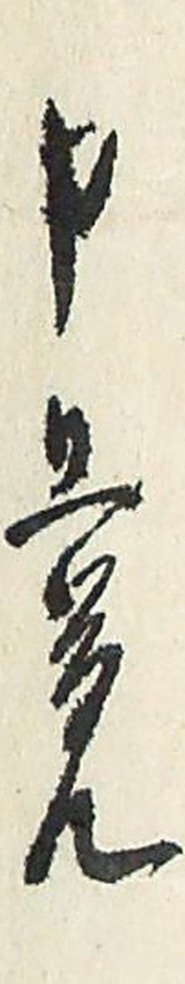申上覚
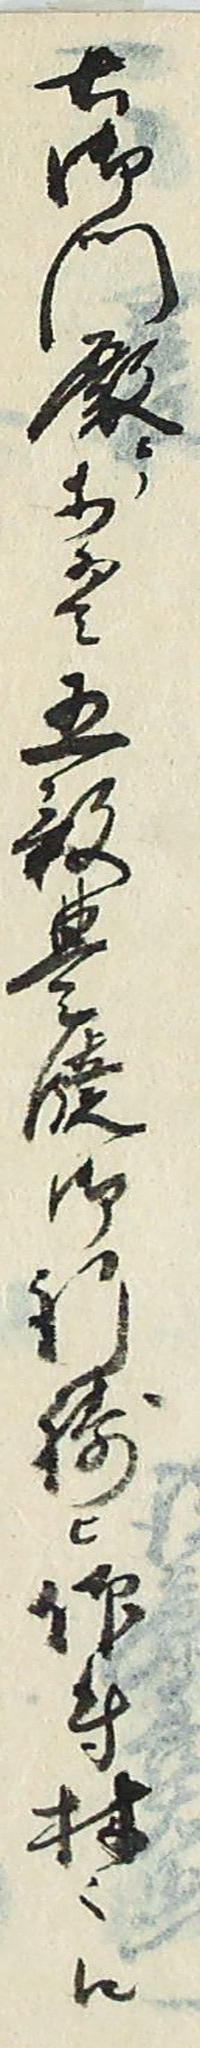土御門殿におゐて五穀豊穣御祈祷被仰付村々江
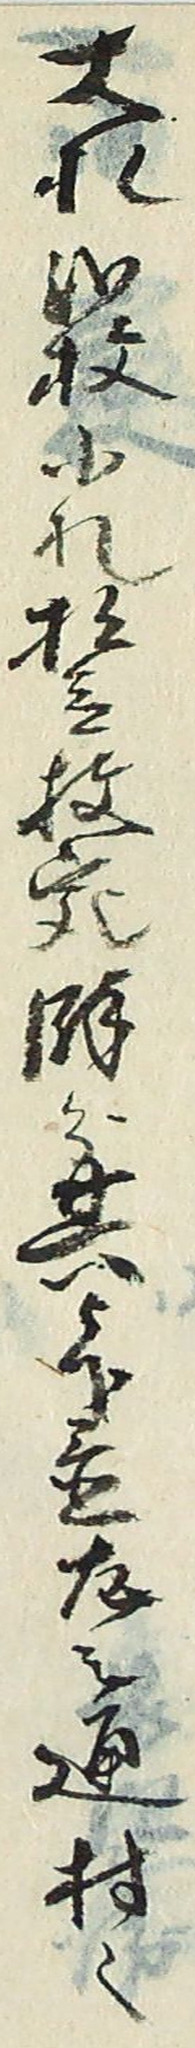大札弐枚小札拾壱枚宛余分共被下置左之通村々
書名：諸御用御□受書控
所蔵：鳴門教育大学 Naruto University of Education
